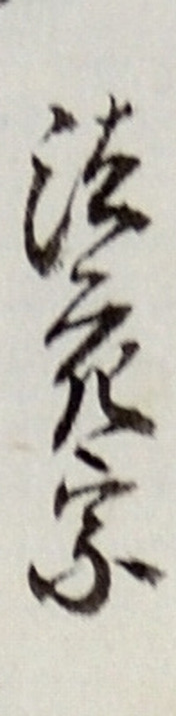法花宗
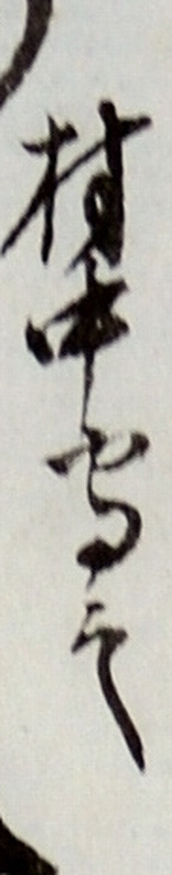村中守之
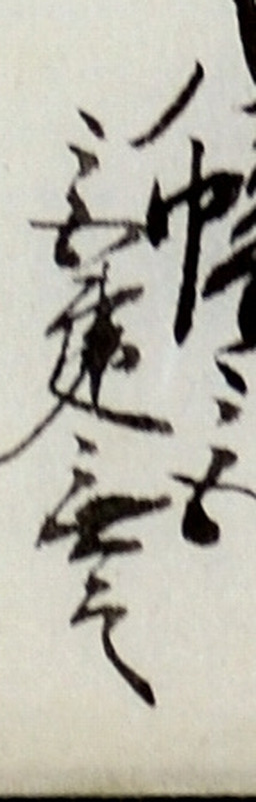宮建無之
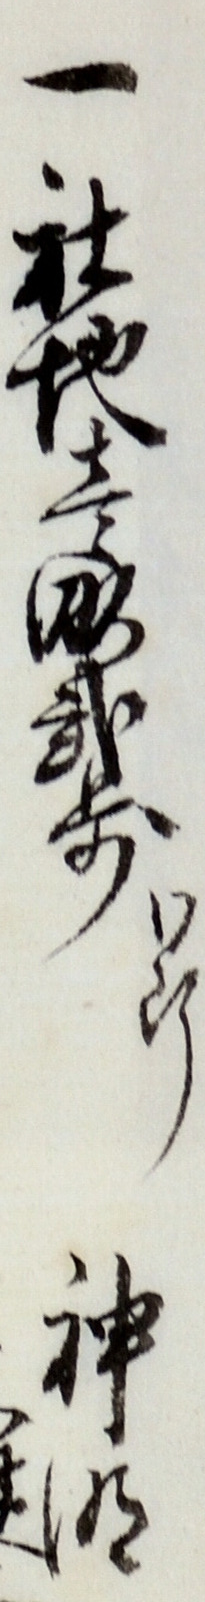一社地壱畝弐歩神明
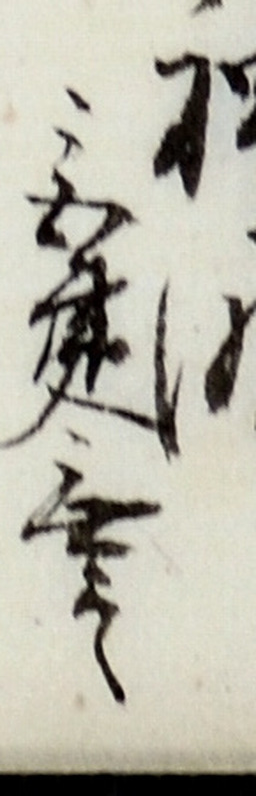宮建無之
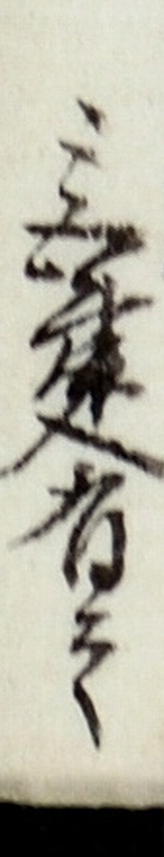宮建有之
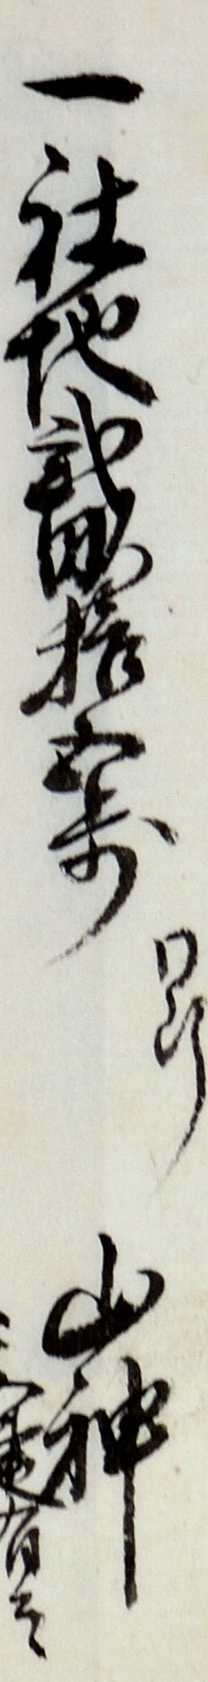一社地弐畝拾五歩山神
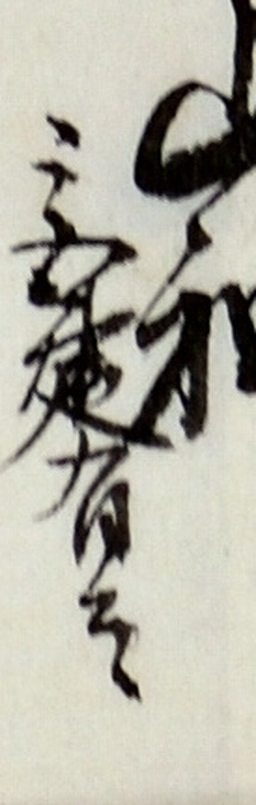宮建有之
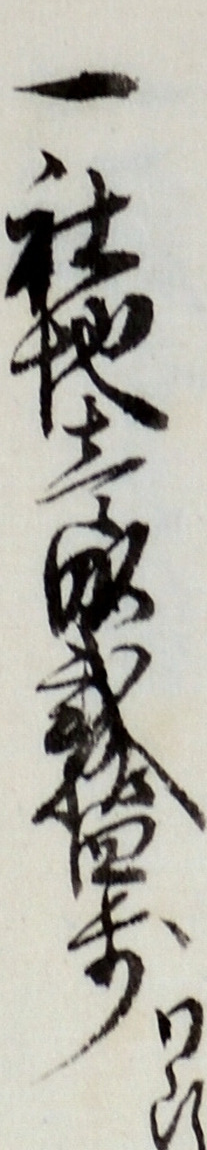一社地壱畝弐拾四歩天狗
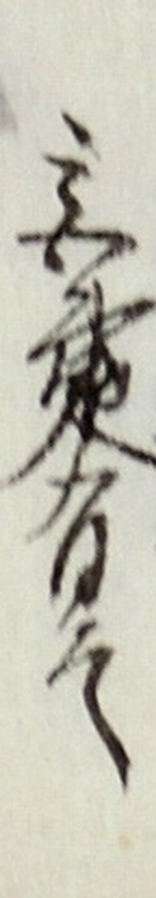宮建有之
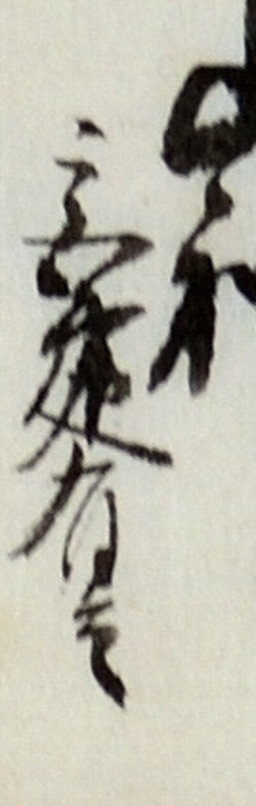宮建有之
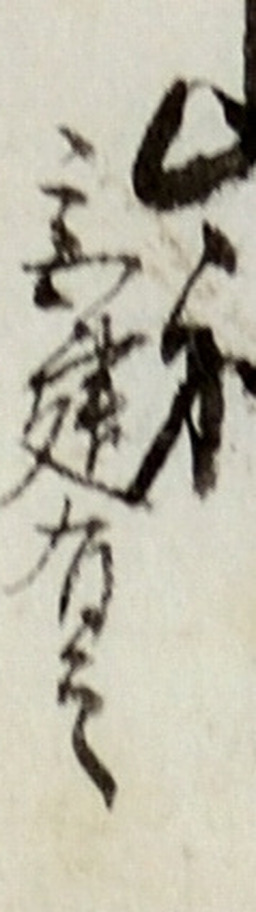宮建有之
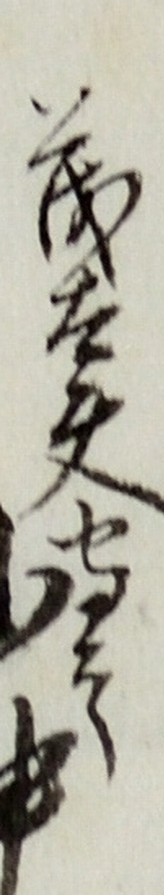茂太夫守之
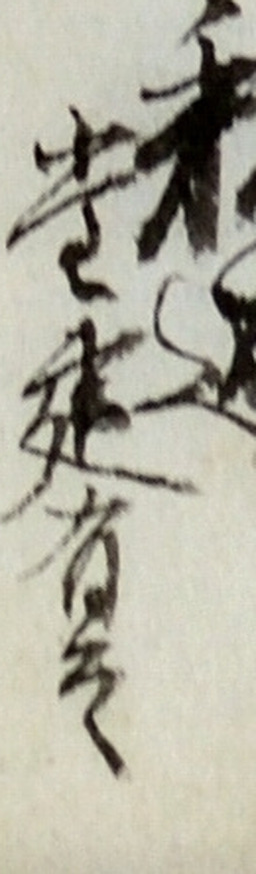堂建有之
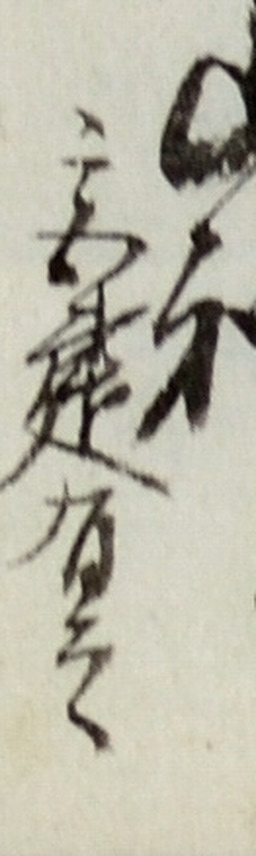宮建有之
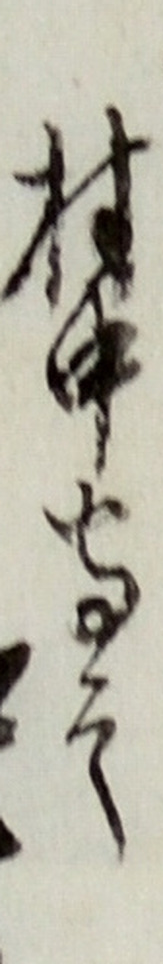村中守之
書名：御領分中山林社地手控
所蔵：伊那市立高遠町図書館・合同会社AMANE
